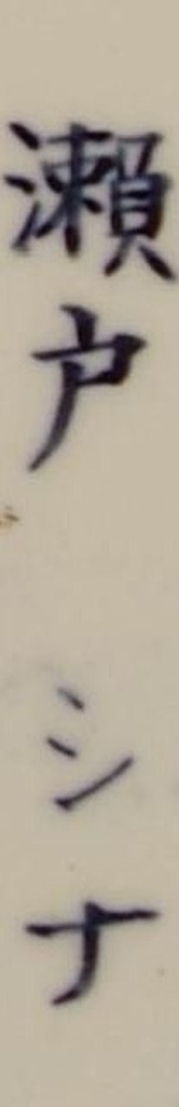瀬戸シナ
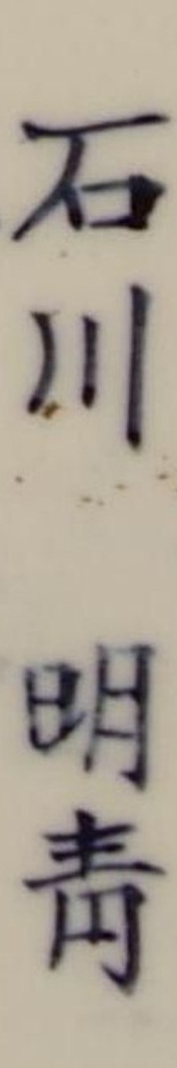石川明青
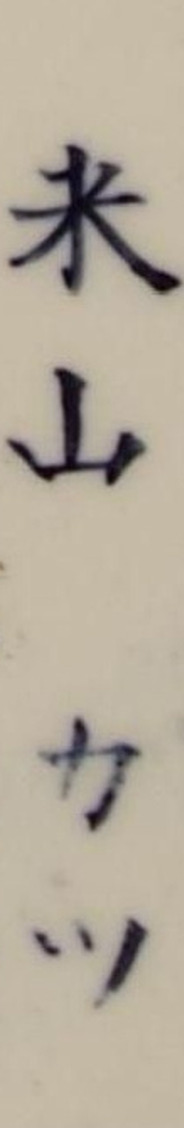米山カツ
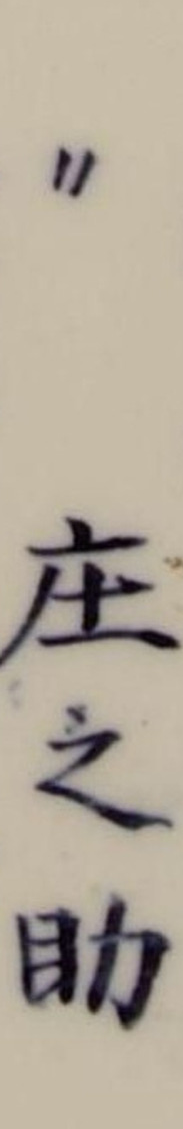庄之助
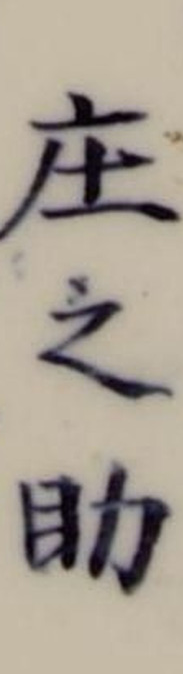庄之助
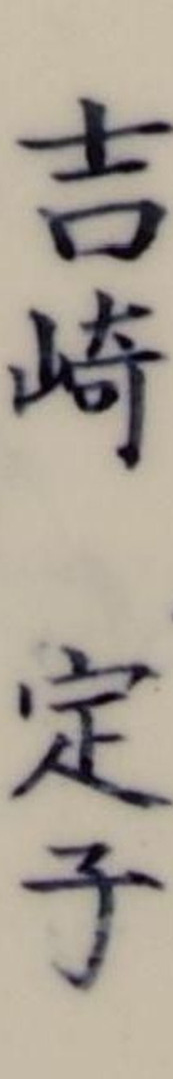吉崎定子
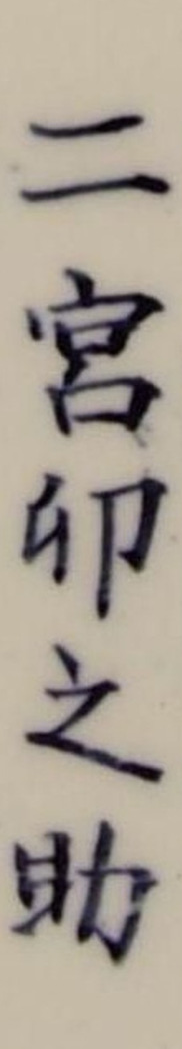二宮卯之助
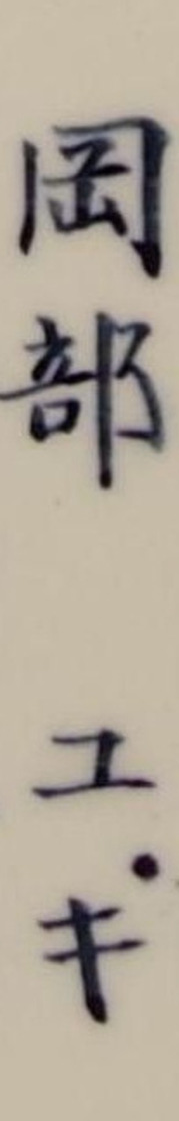岡部ユキ
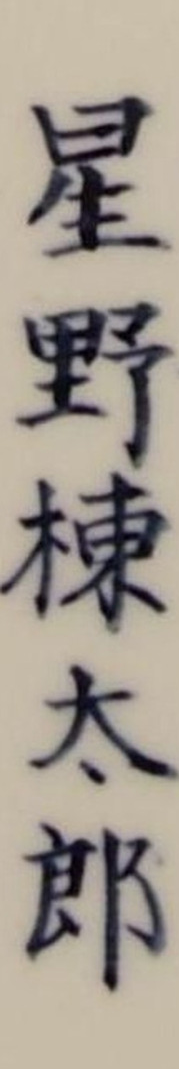星野棟太郎
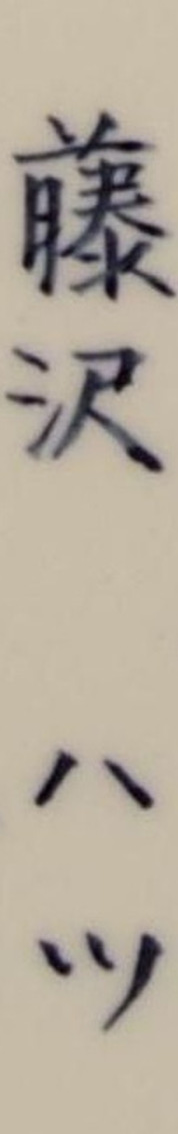藤沢ハツ
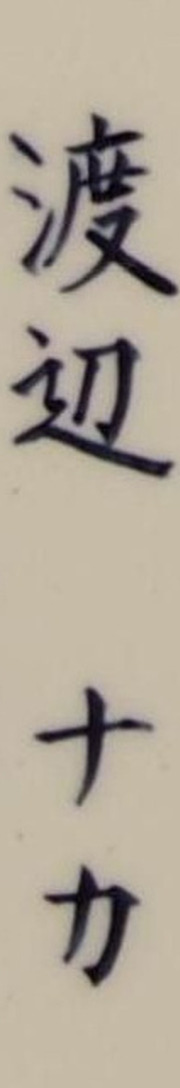渡辺ナカ
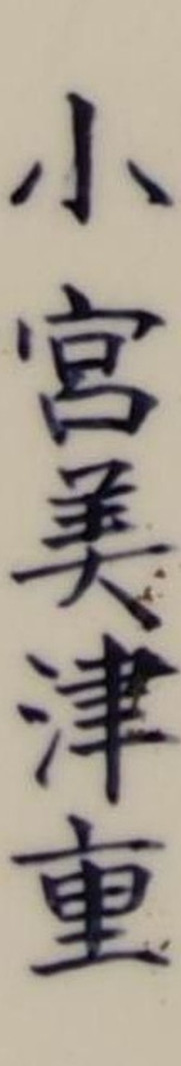小宮美津重
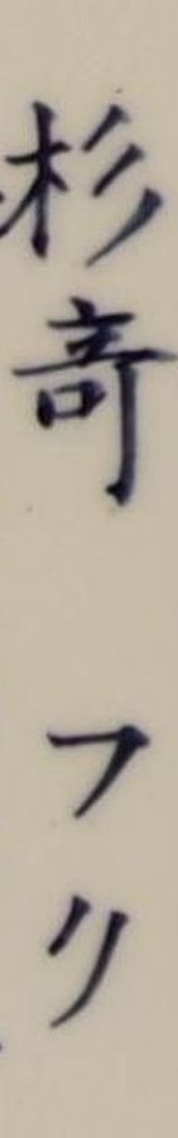杉竒フク
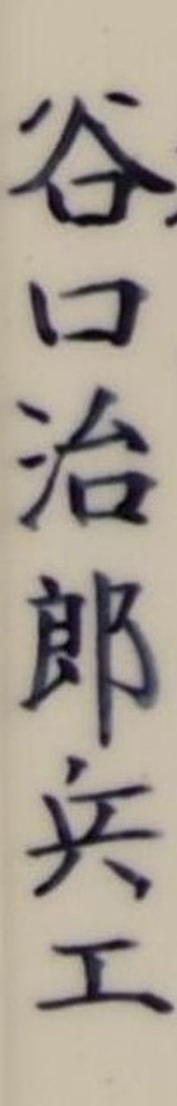谷口治郎兵衛

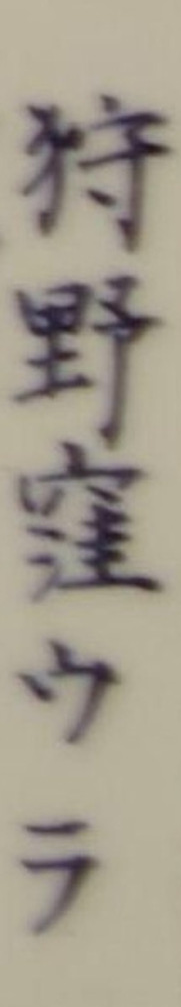狩野窪ウラ
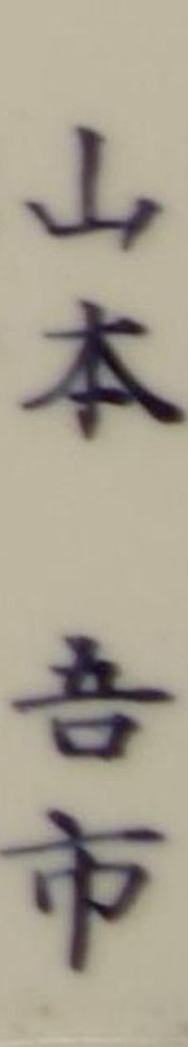山本吾市
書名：E~L
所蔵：高野山金剛峯寺
